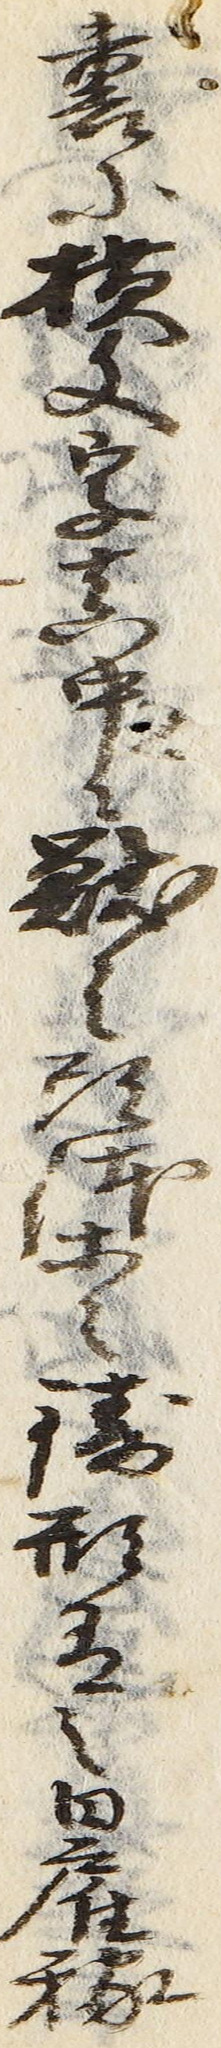裏に横文字真中之獣之頭体等之鋳形有之日雇稼
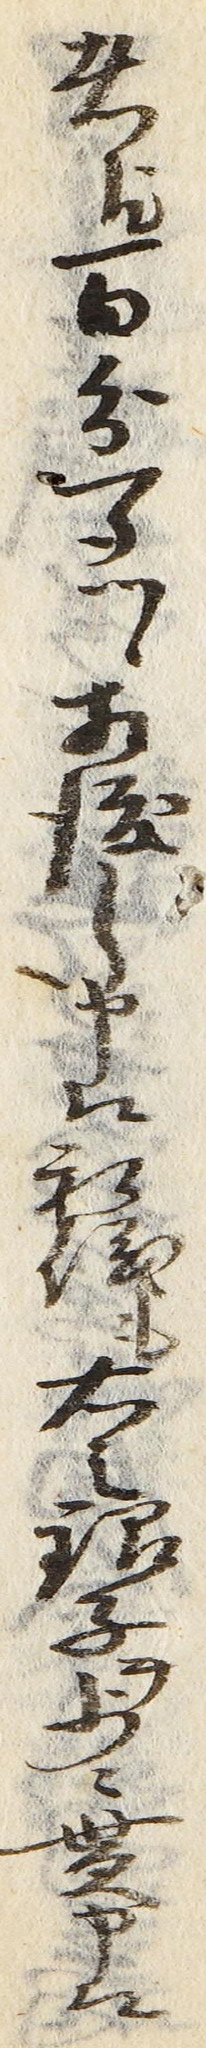者江一日分一ツヽ相渡し申候私儀も右之銀子ヲ少々貰申候
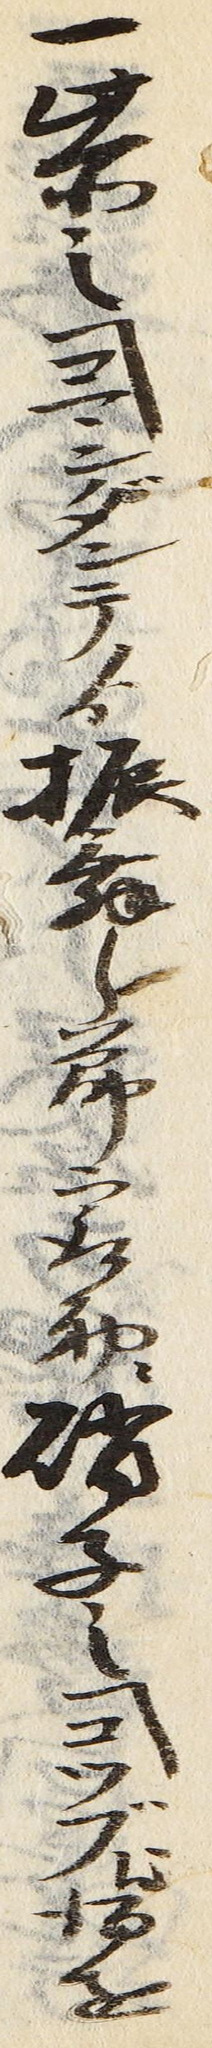一此所之「コマンダンテゟ振舞之節最初ニ硝子之「コツブ江
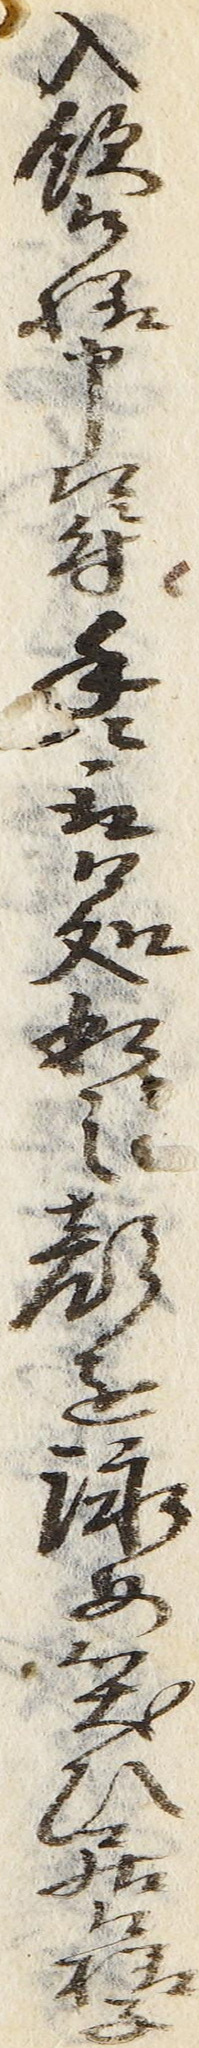入飲候様申候ニ付手ニ取候処私之顏を詠め笑ひ居候様子
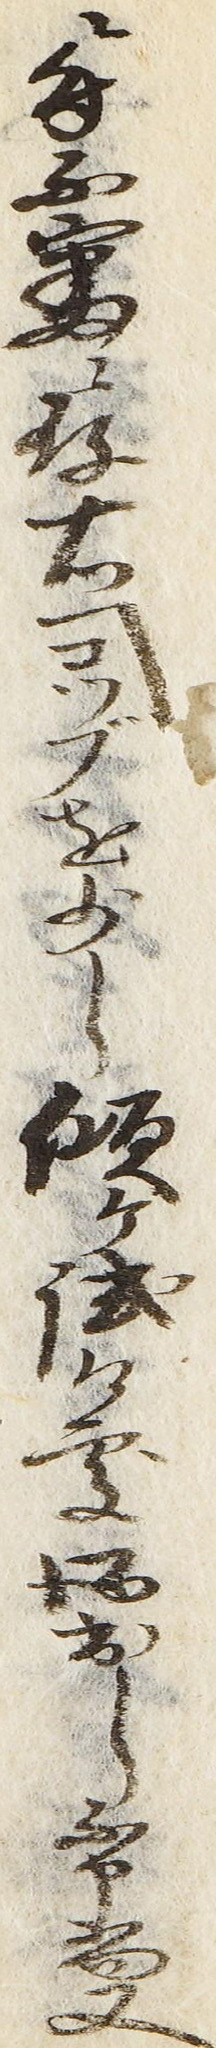ニ付不審ニ存右「コツブを少し傾ケ試候處酒出し不申尚又
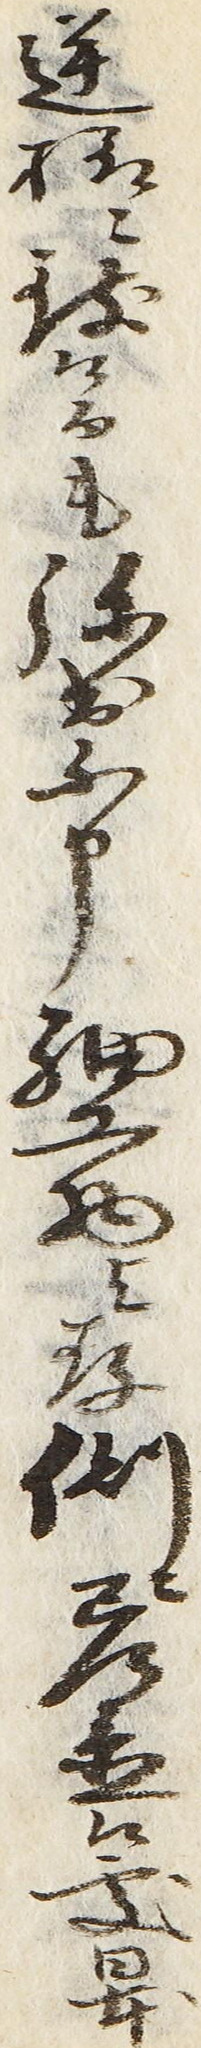逆様ニ致し候而も弥出不申細工物と存側ニ差置候處日本
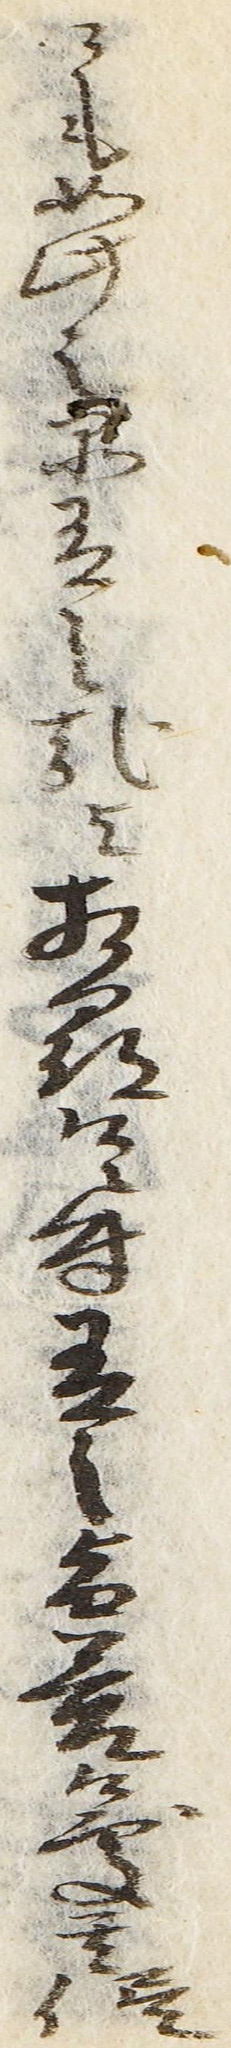ニも如此之品有之哉と相尋候ニ付有之旨答候處其儘
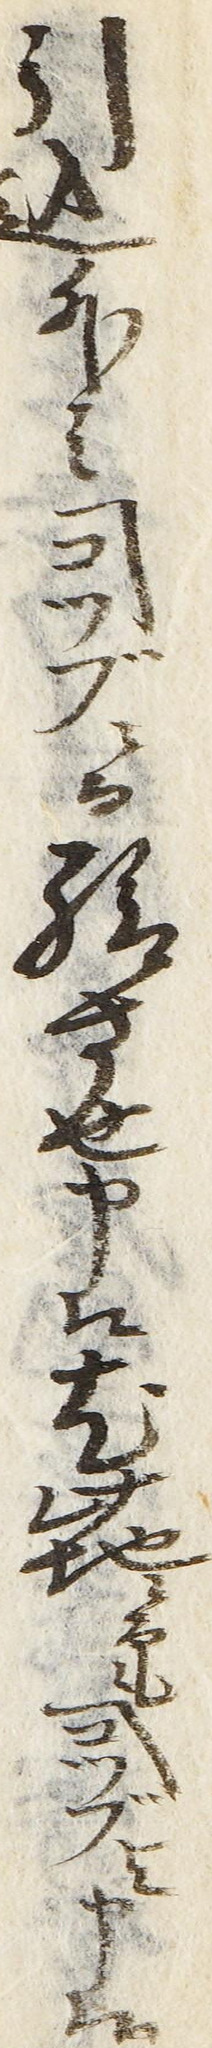引込外之「コツブニ而給させ申候尤此地ニ而も「コツブと申候
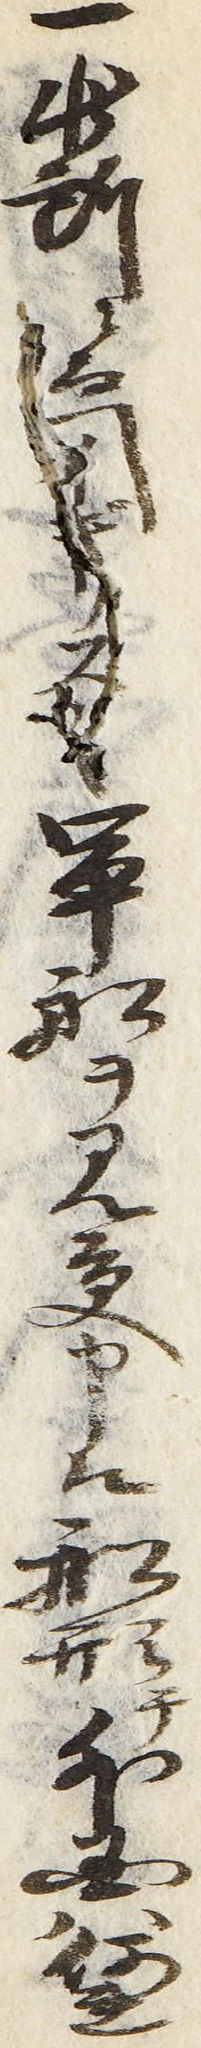一此所ニ而「イギリス之軍舩ヲ見受申候舩形チ外国ハ何れ
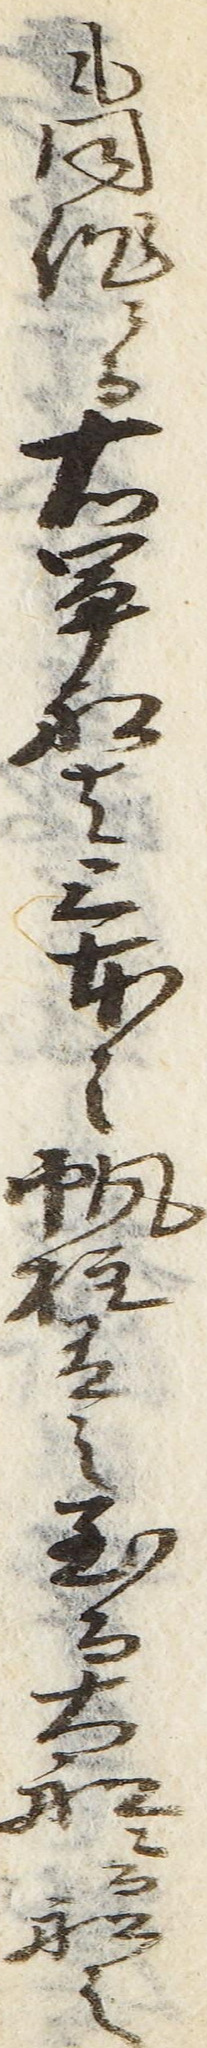も同作ニ而右軍舩者三本之帆柱有之至而大舩ニ而舩之
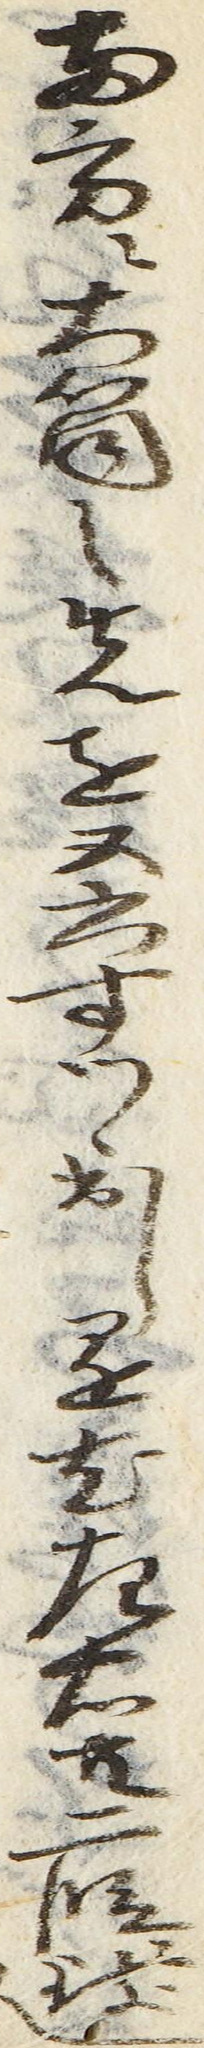両方ニ大筒之先を五六寸ツヽ出し懸尤左右共二段ニ致し

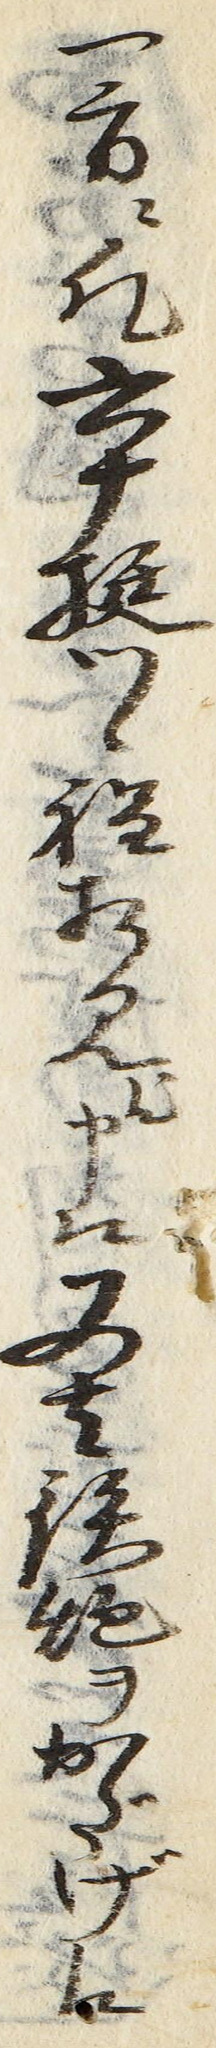一方ニ凡六十挺ツヽ程相見江申候又者鉄炮ヲかだげ候
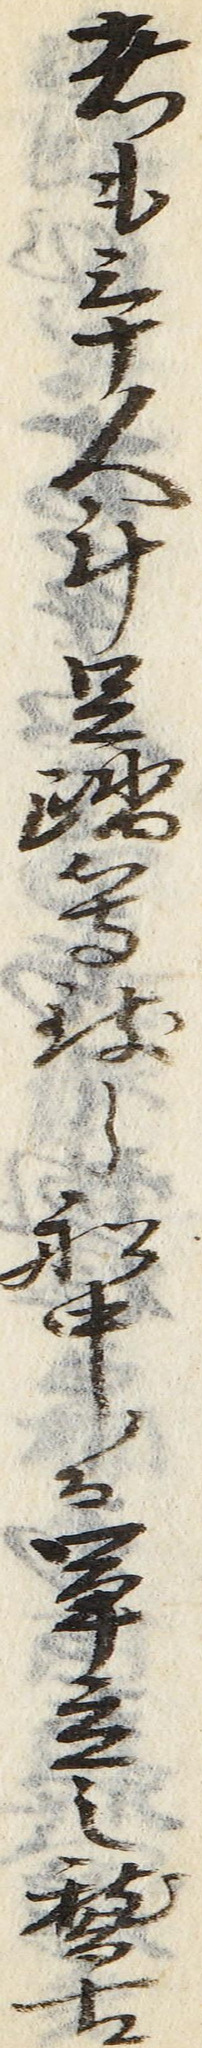者も三十人斗足踏等致し舩中ニ而軍立之稽古
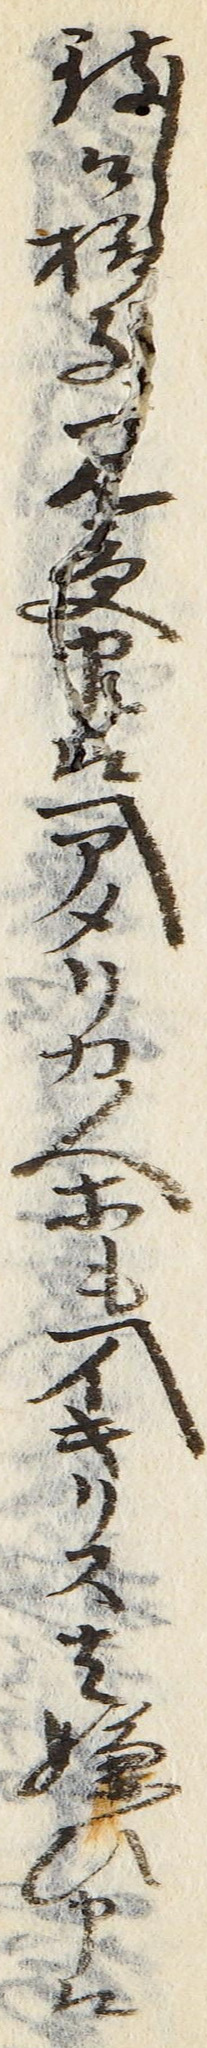致候様子見受申候「アメリカ人等も「イキリス者嫌ひ申候
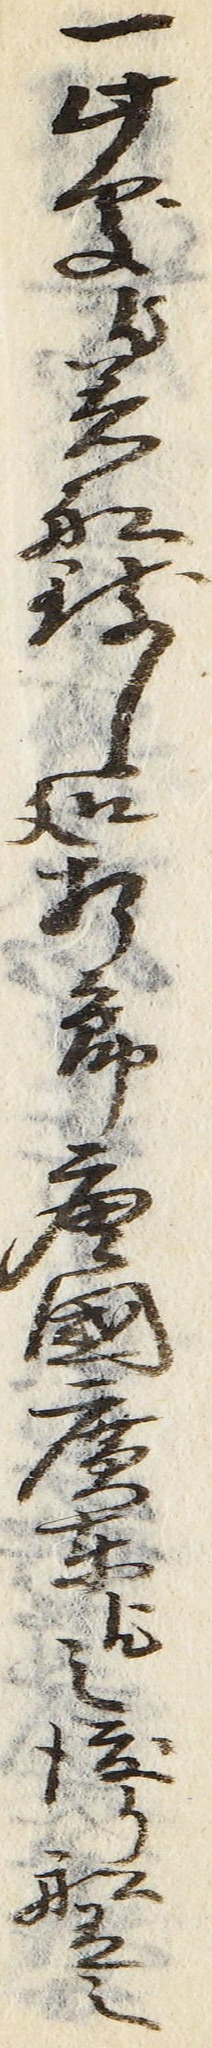一此處江着舩致候処折節唐国廣東江之渡り舩有之
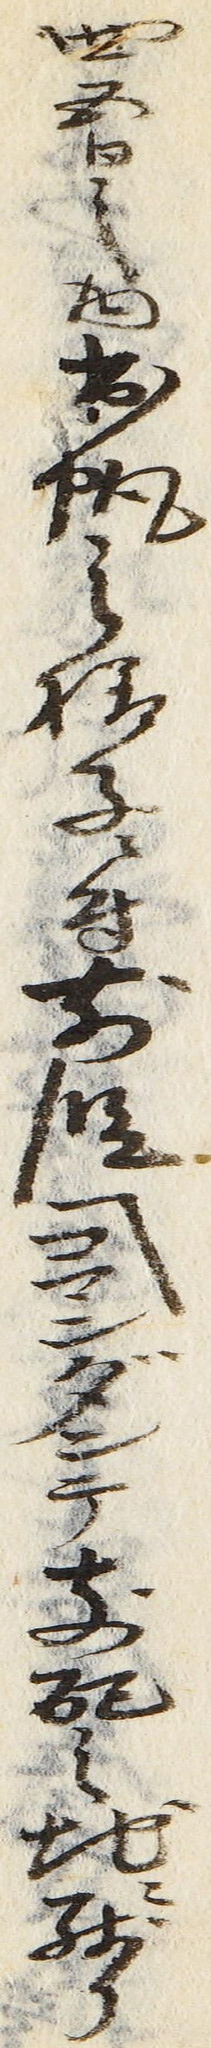四五日之内出帆之様子ニ付前段「コマンダンテ支配之地ニ残り
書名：漂流人善助聞書
